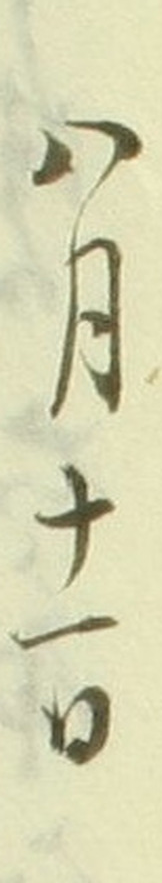八月十一日
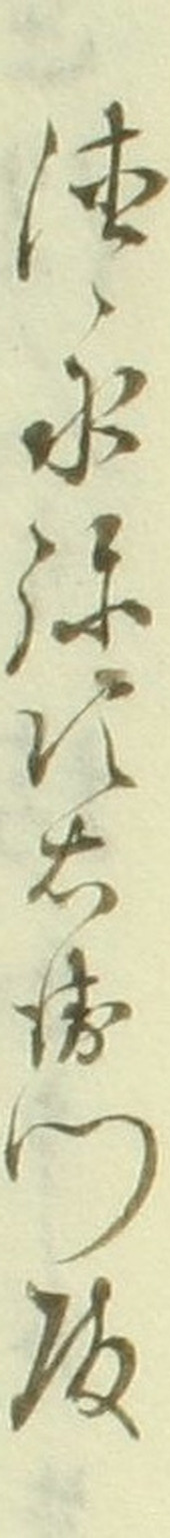徳永弥次右衛門殿
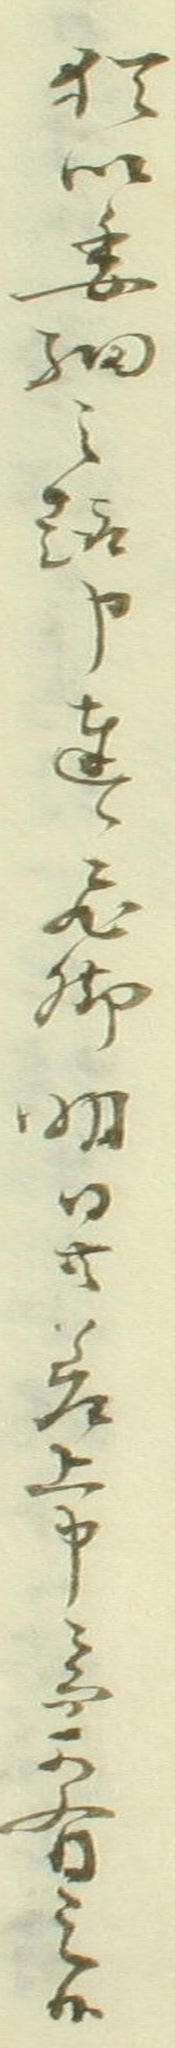猶御委細之趣申達候飛脚明日共差上申に而可有之候
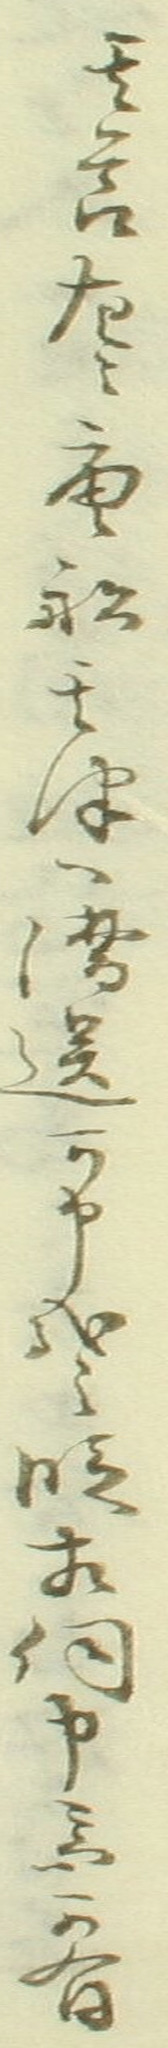其節左之唐船其津へ漕送可申哉之段相伺申に而可有
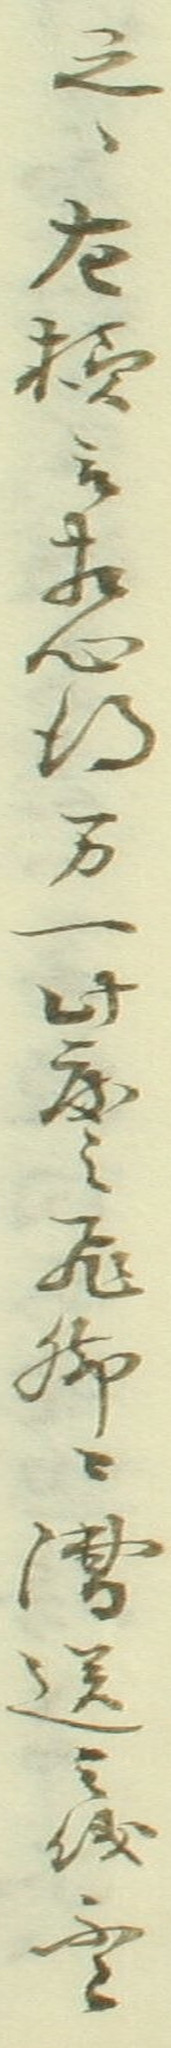之候左様被相心得万一此度之飛脚に漕送之儀ふと
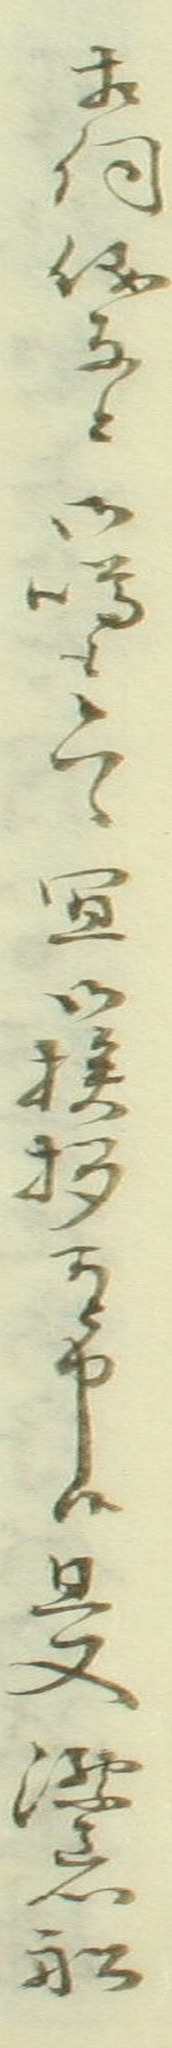相伺儀なと御噂も候はゝ宜御挨拶可被申候且又漂着船
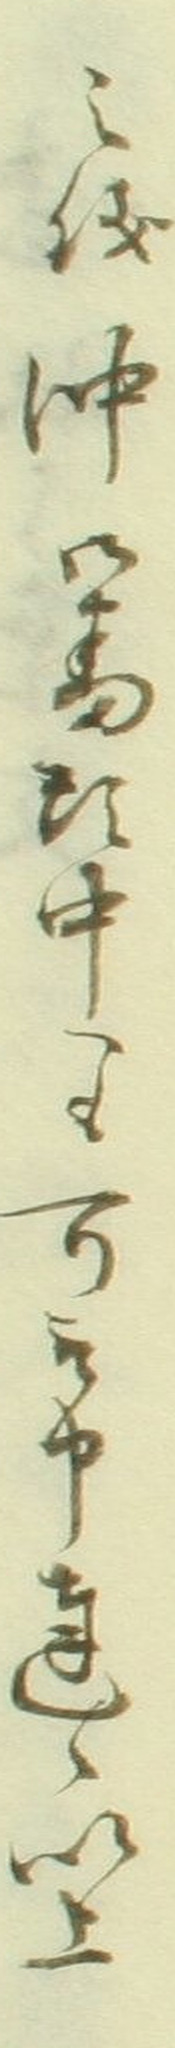之儀沖御番頭中へも可被申達候以上

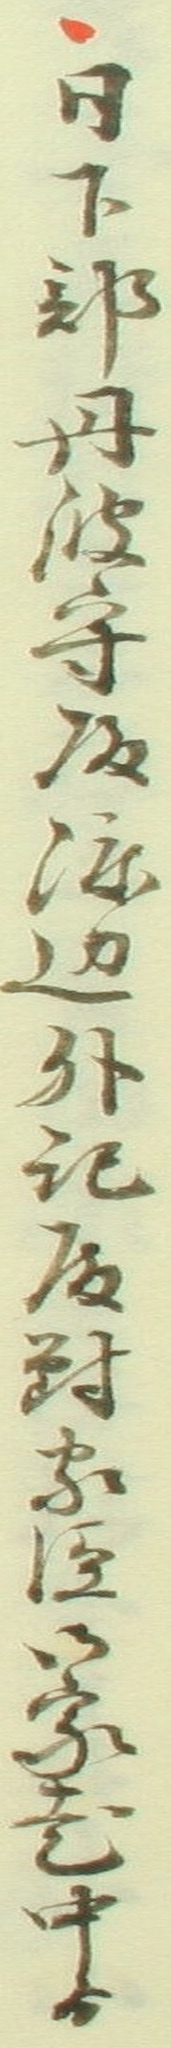日下部丹後守殿渡辺外記殿対家臣御家老中ゟ
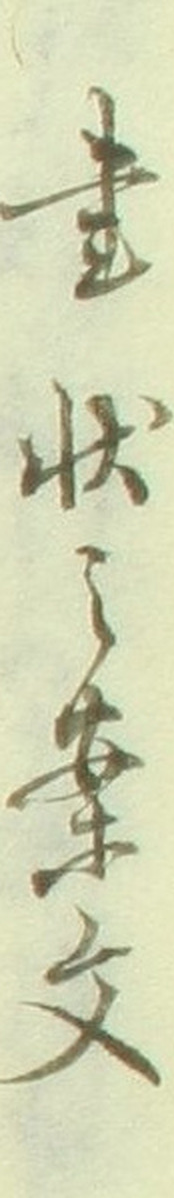書状之案文
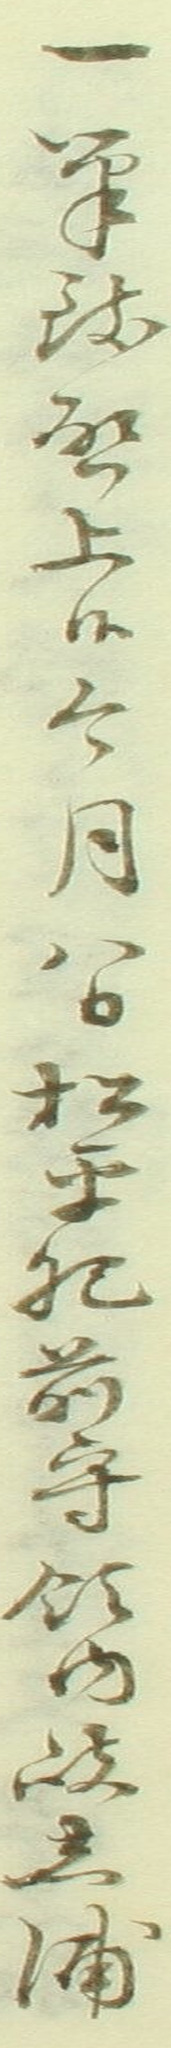一筆致啓上候今月八日松平肥前守領内岐志浦
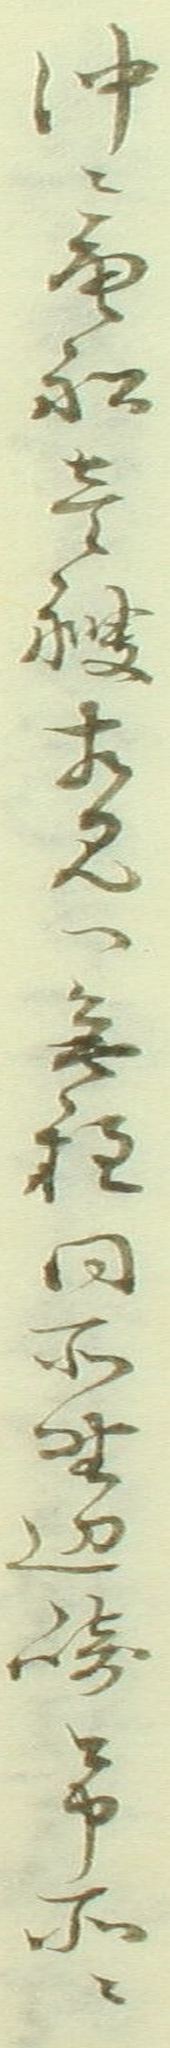沖に唐船壱艘相見へ無程同所野辺崎と申所に
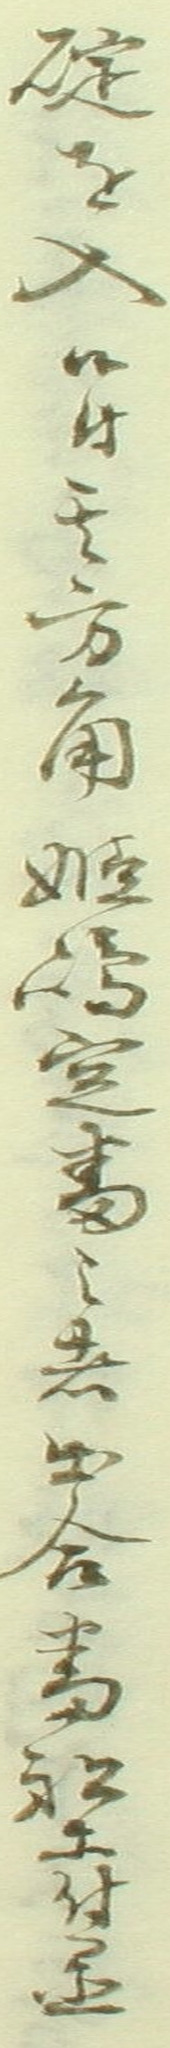碇を入候付其方角姫島定番之者出合番船等付置
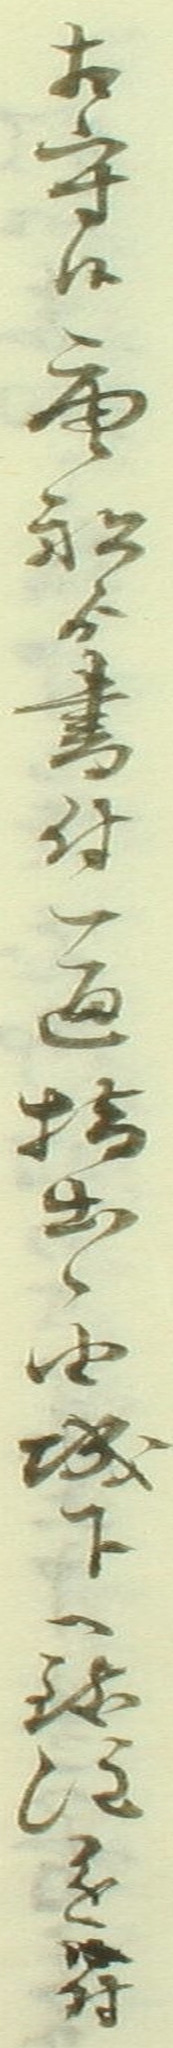相守候唐船ゟ書付一通指出候由城下へ致注進候付
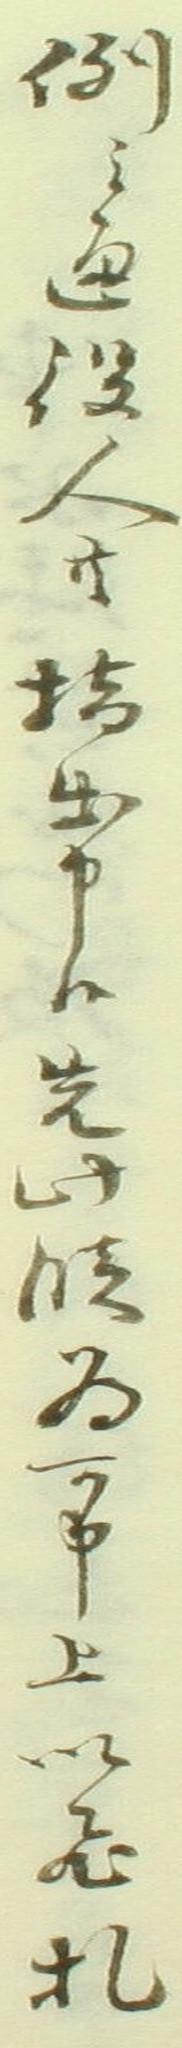例之通役人共指出申候先此段為可申上御飛札
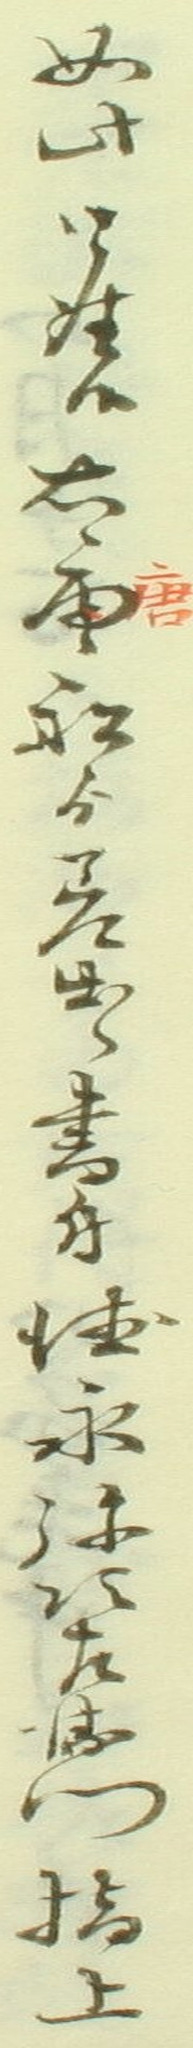如此御座候右之唐船ゟ差出候書付徳永弥次左衛門指上
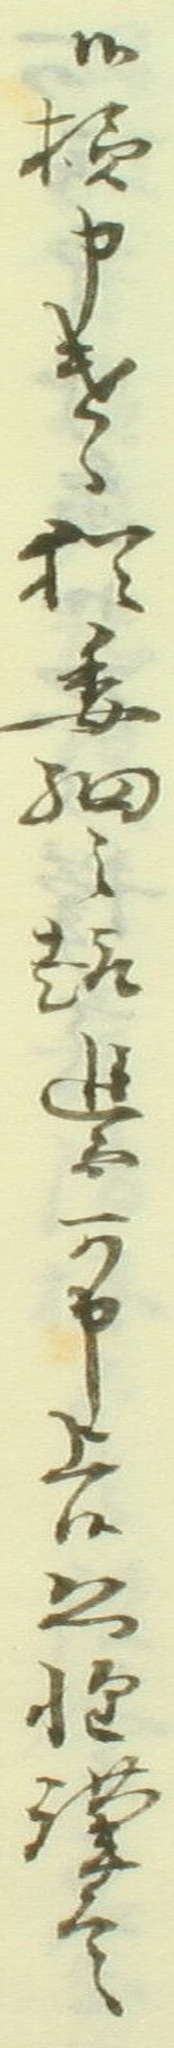候様申遣候猶委細之趣追而可申上候恐惶謹言
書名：異国船漂着記
